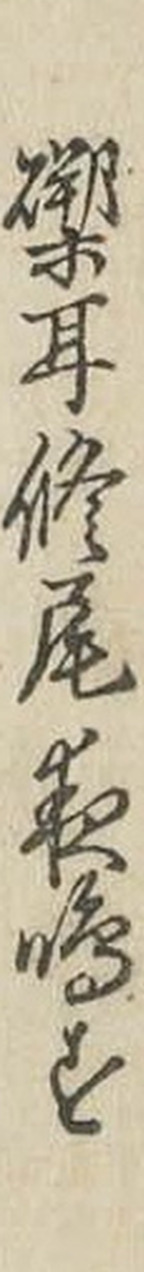磔耳修尾夜鳴す
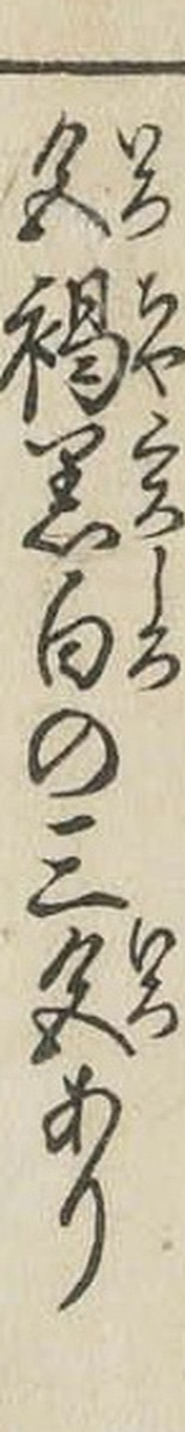色褐黒白の三色あり
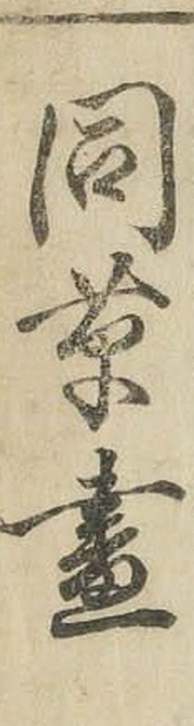同草画

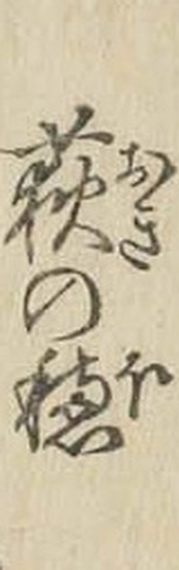荻の穂
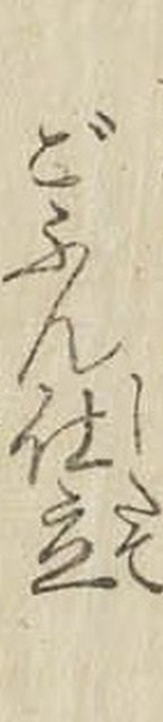ごふん仕立
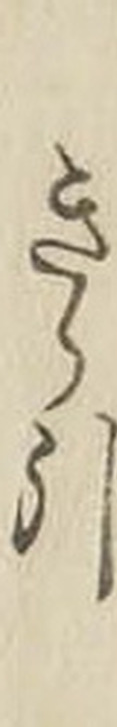きら引
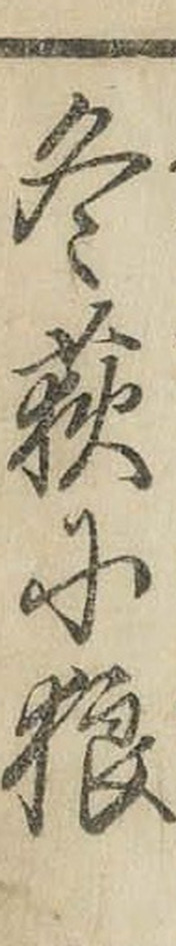冬荻に狼

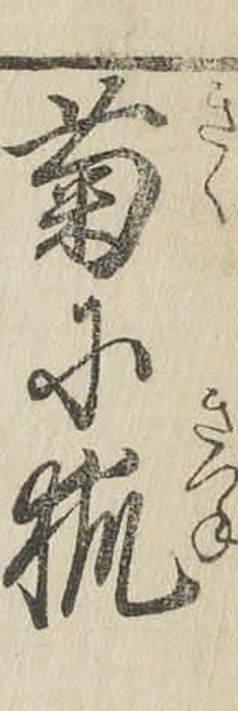菊に狐
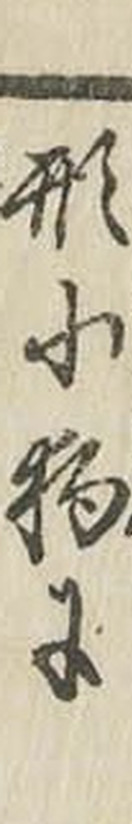形子狗に
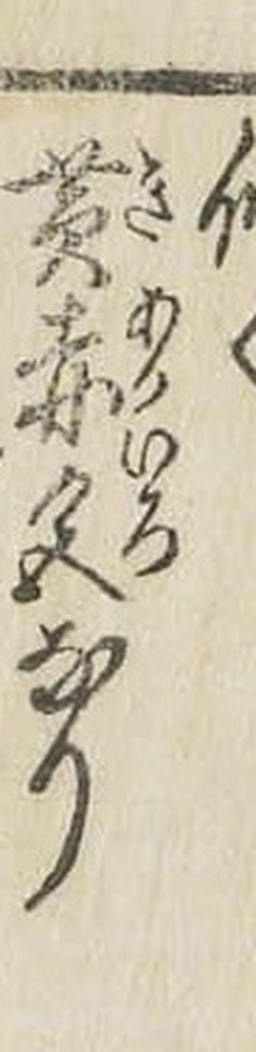黄赤色なり
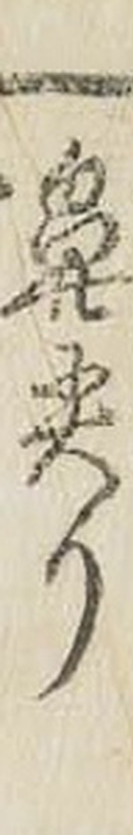鼻尖り
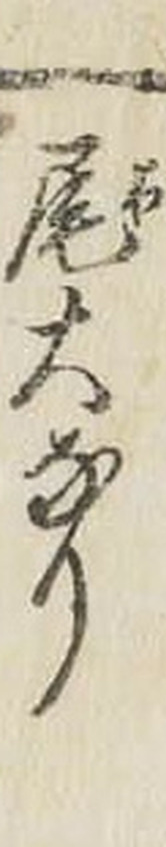尾大なり
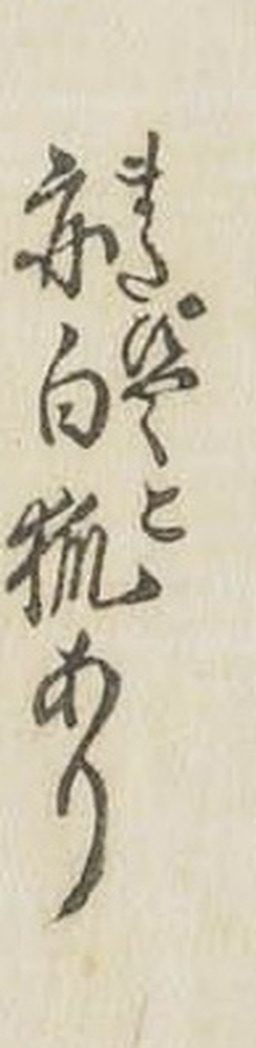亦白狐あり

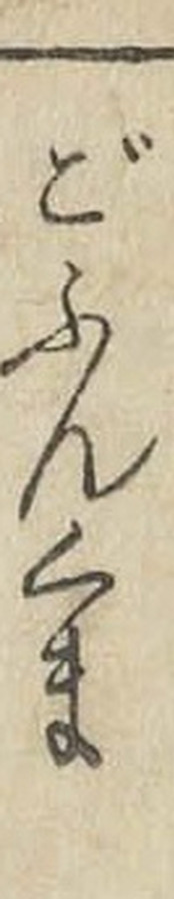ごふんくま
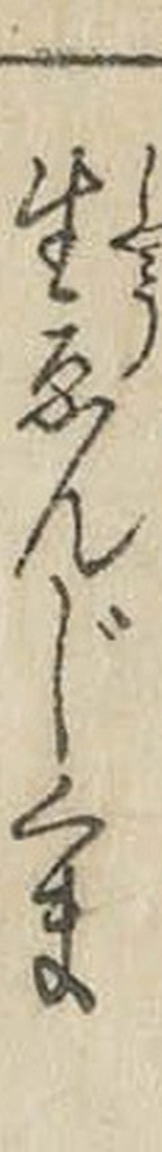生ゑんじくま
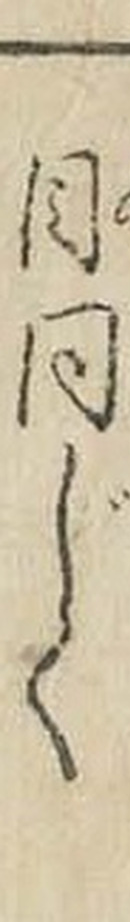目同じく
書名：絵本写宝袋 9巻 9之巻下
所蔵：東京学芸大学教育コンテンツアーカイブ
